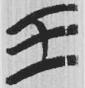王
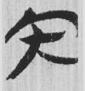內（入）
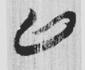㠯（以）
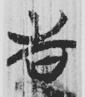告
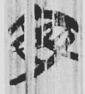安
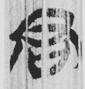君
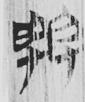與
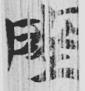陵
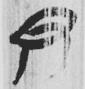尹
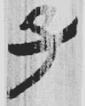子
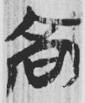高
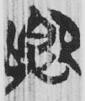卿
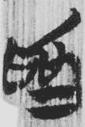爲
